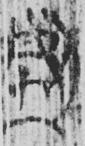型（刑）
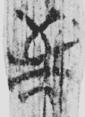至
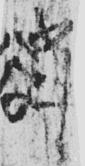欲
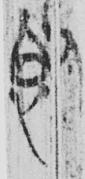飤（食）
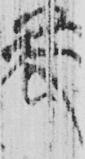而
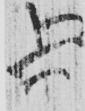上
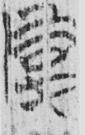厚
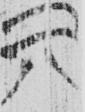亓
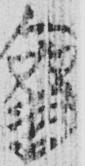斂（歛）
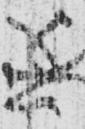至
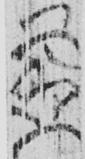亞（惡）
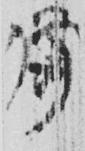何（苛）
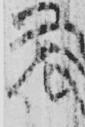而
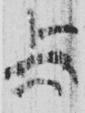上
